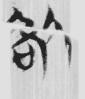咎
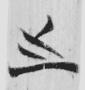之
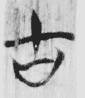古
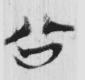公
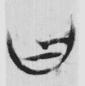曰
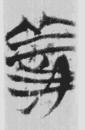義
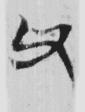父
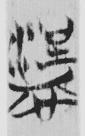{浧皿}
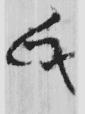氏
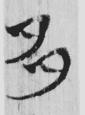多
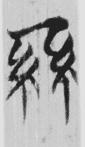{一糸糸}
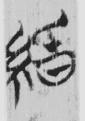緍
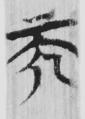而
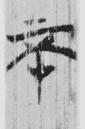不
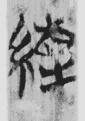{糸屮目牛}
